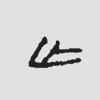亡
